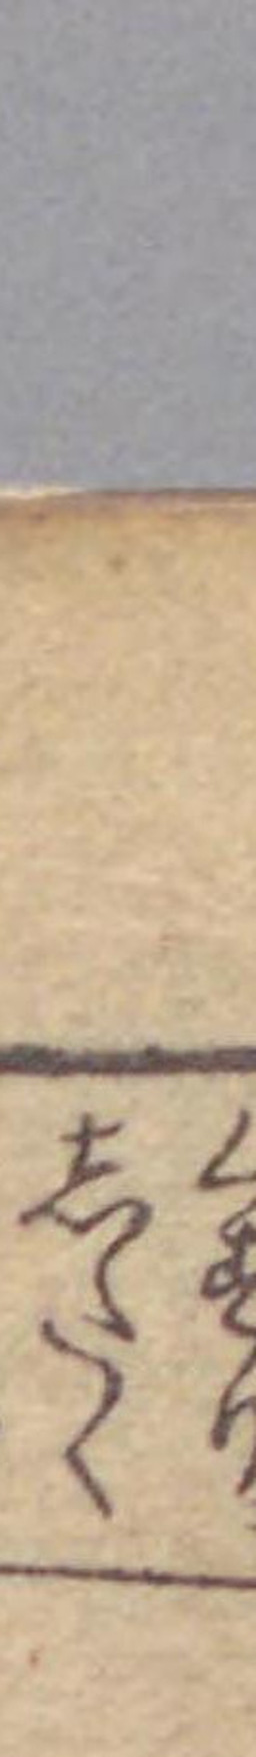したく
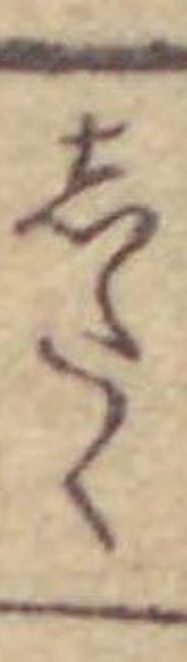したく
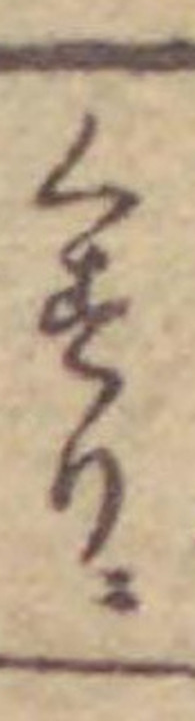くすりに
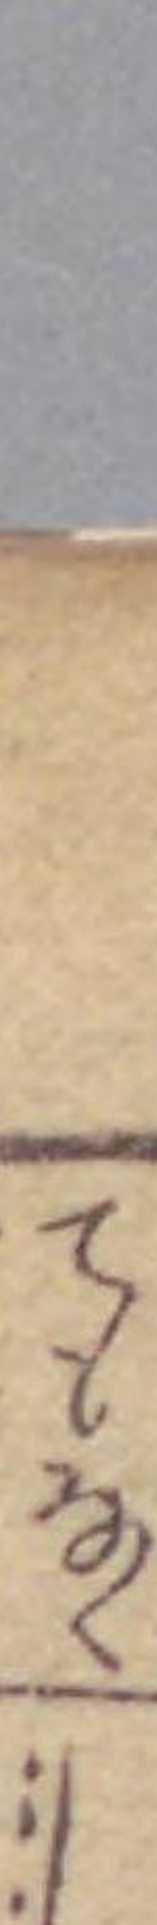てもなく
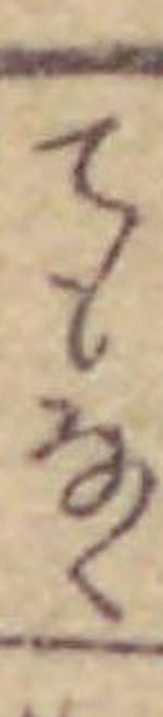てもなく
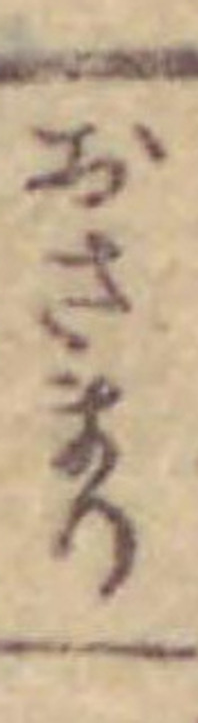おさまり
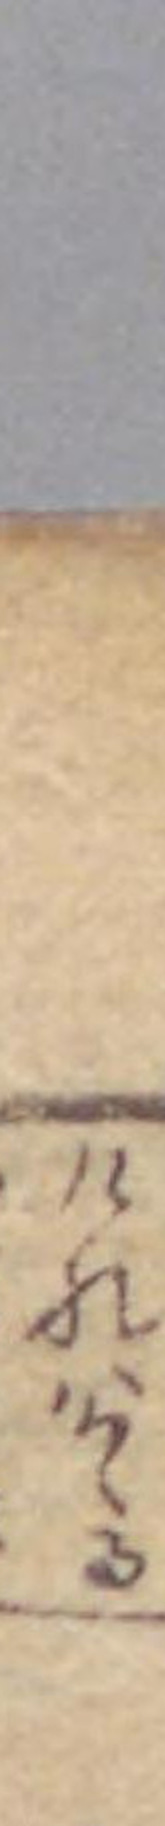けれはかゝる
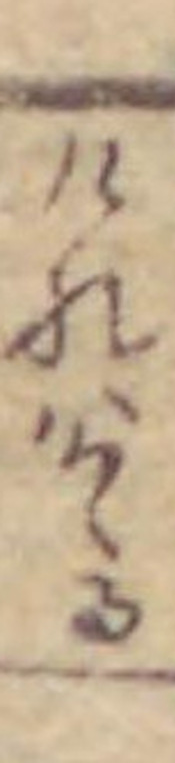けれはかゝる
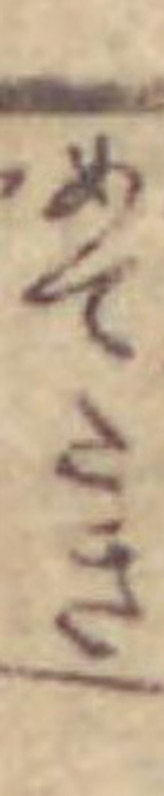めてたき
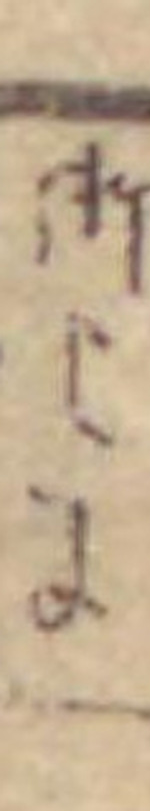御よに
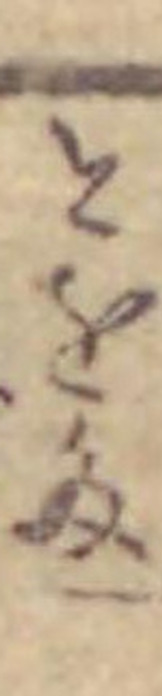とをた
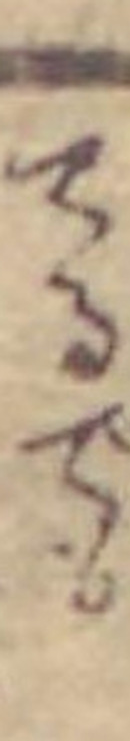てるでも
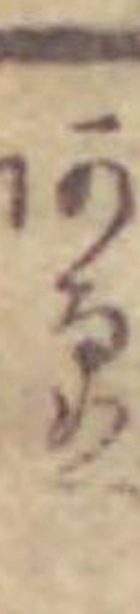あるめへ
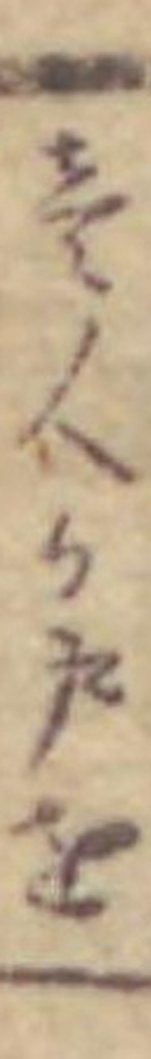壱人か戸を
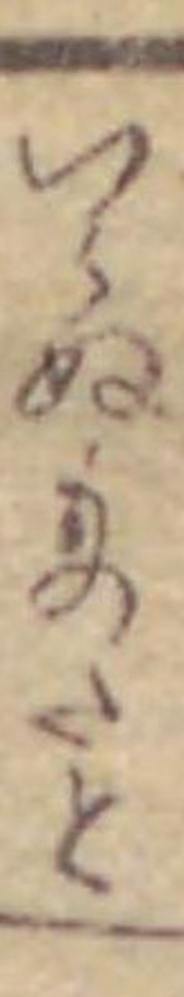いらぬものたと
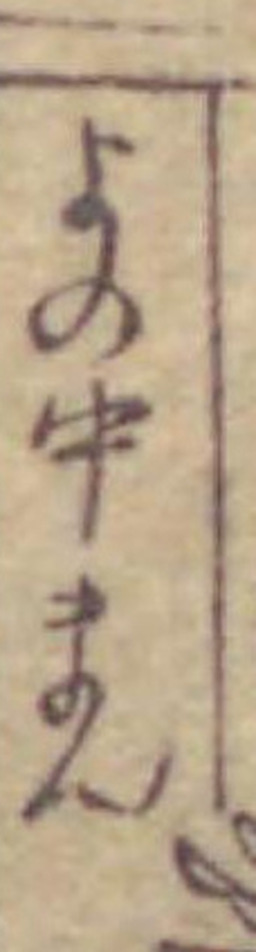よの中まん
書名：天下一面鏡梅鉢 : 3巻
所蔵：国立国会図書館 National Diet Library, JAPAN
